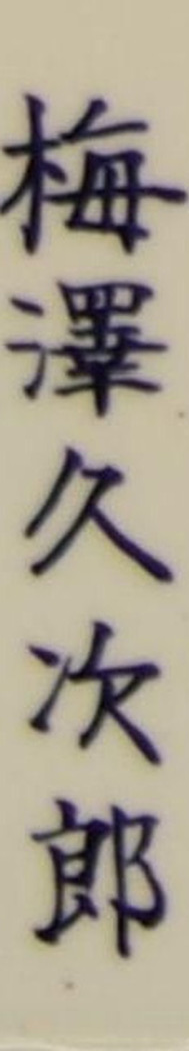梅澤久次郎
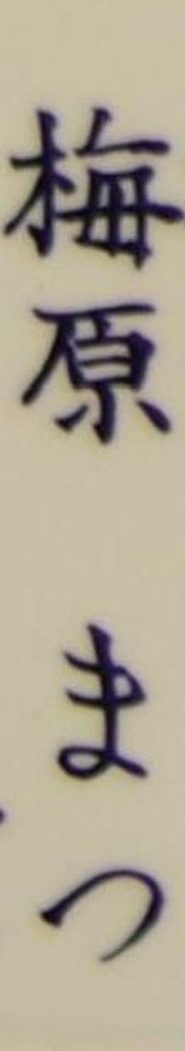梅原まつ

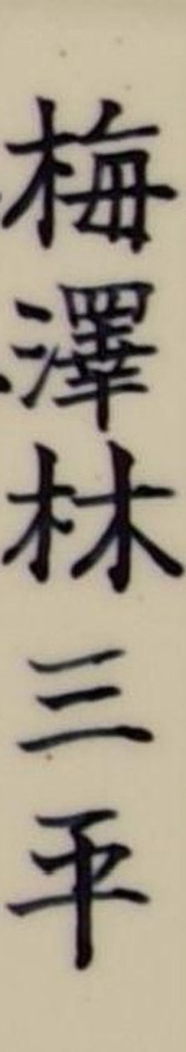梅澤林三平
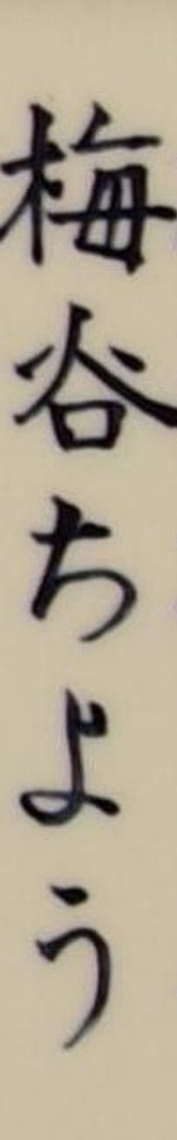梅谷ちよう
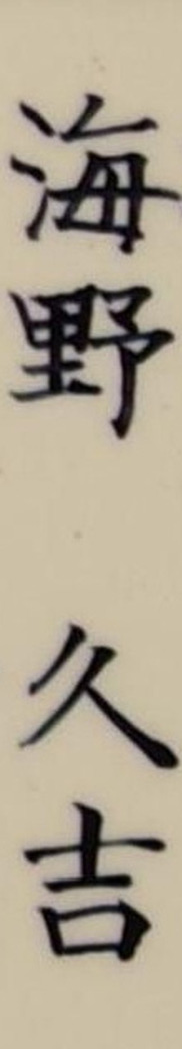海野久吉
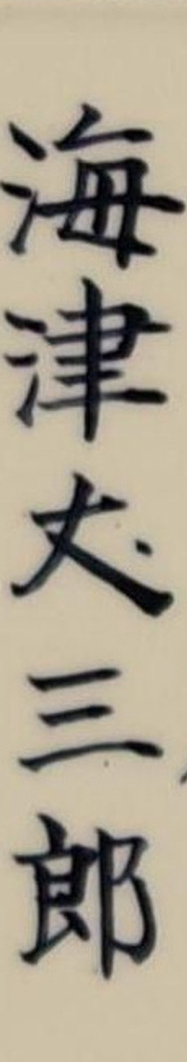海津丈三郎
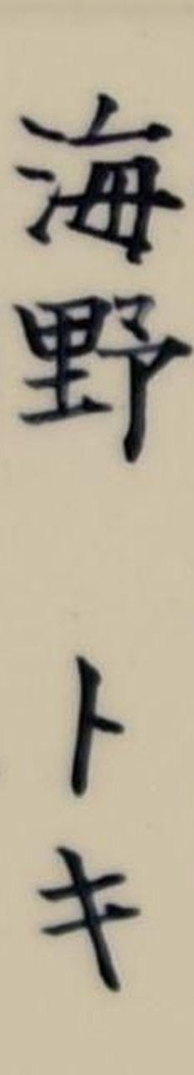海野トキ
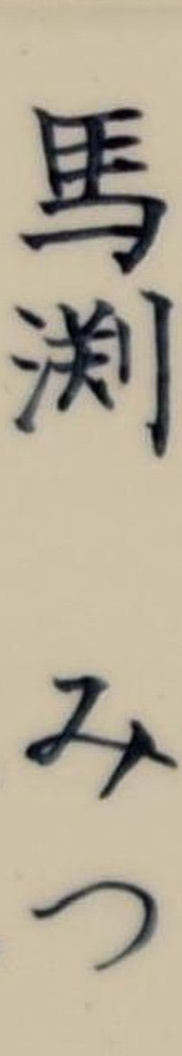馬渕みつ
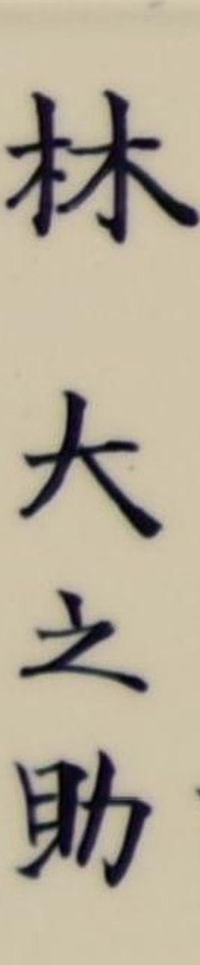林大之助
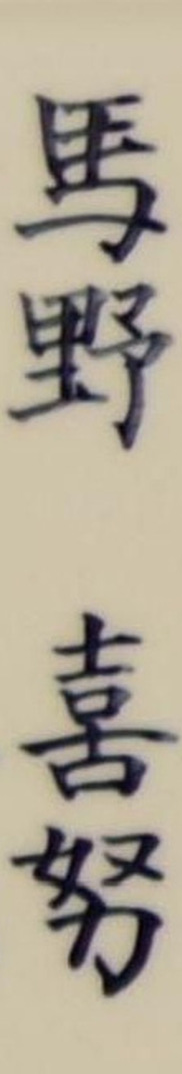馬野喜努
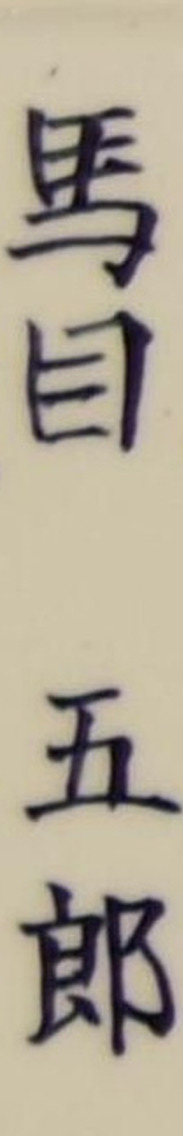馬目五郎
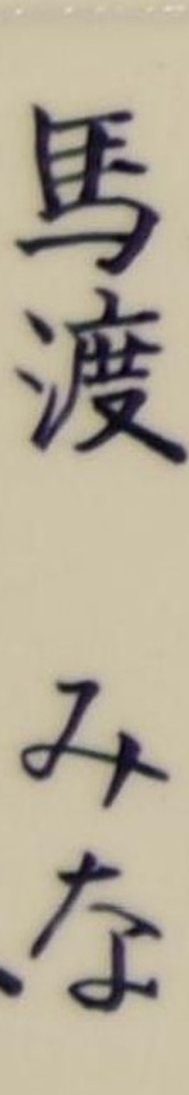馬渡みな
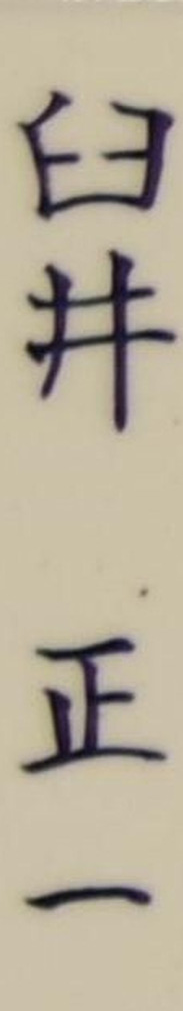臼井正一

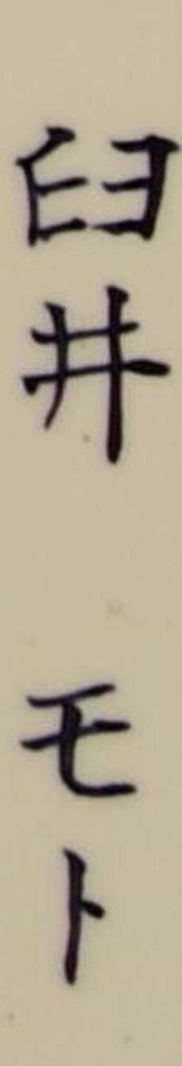臼井モト
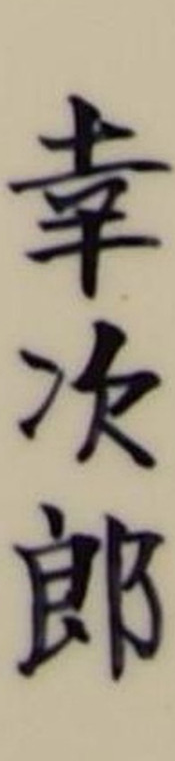幸次郎
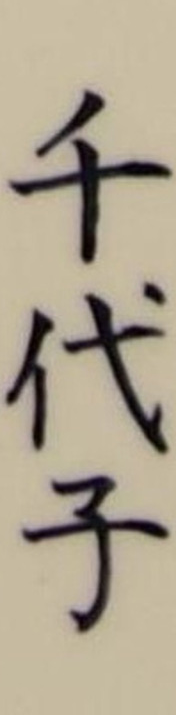千代子
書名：A~D
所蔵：koyasan kongobuji
